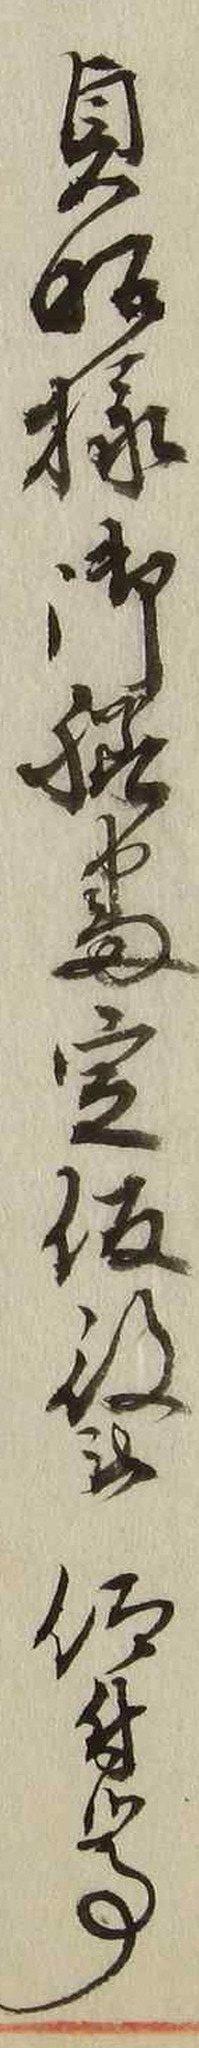貞昭様御膳番定仮役被仰付候事
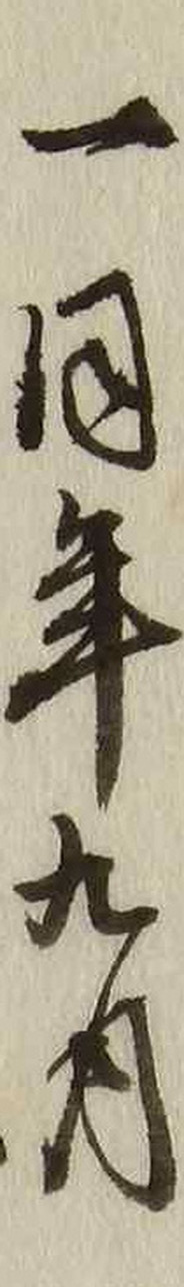一同年九月
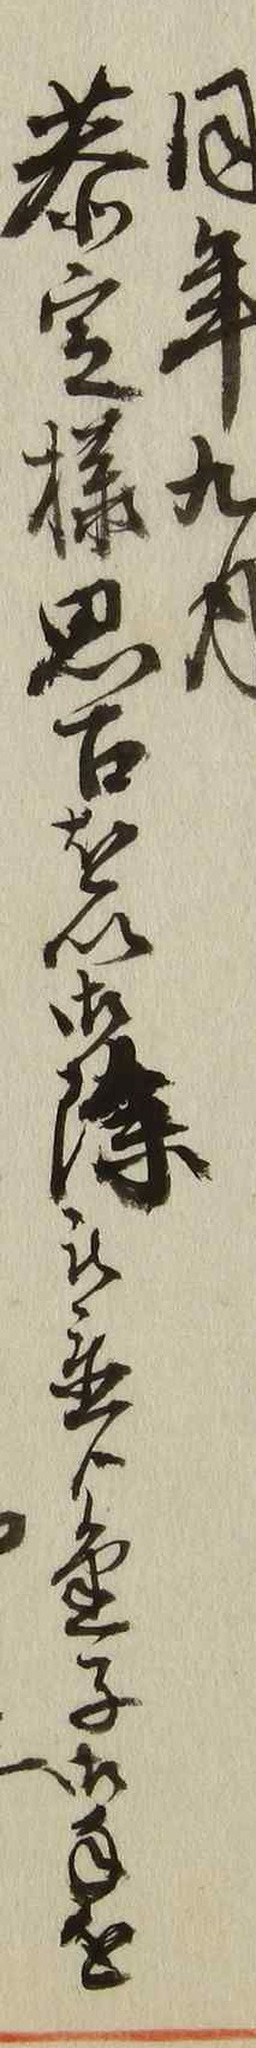恭定様思召を以御除被置候金子御手を
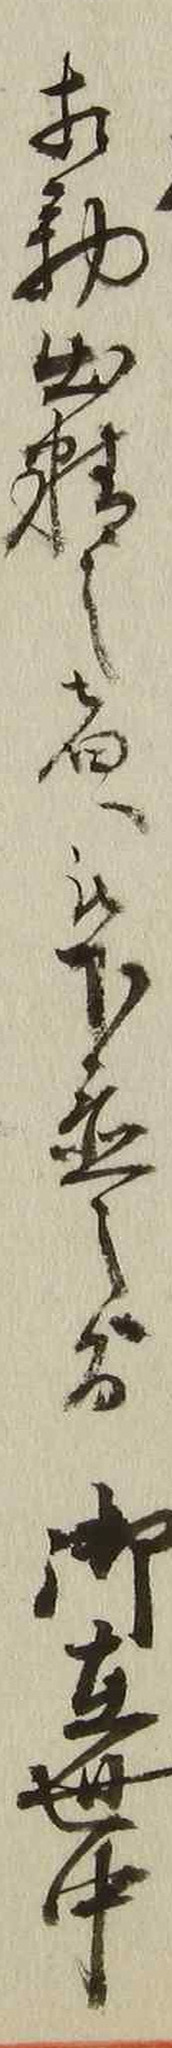相勤出精之者へ被下置之旨御在世中
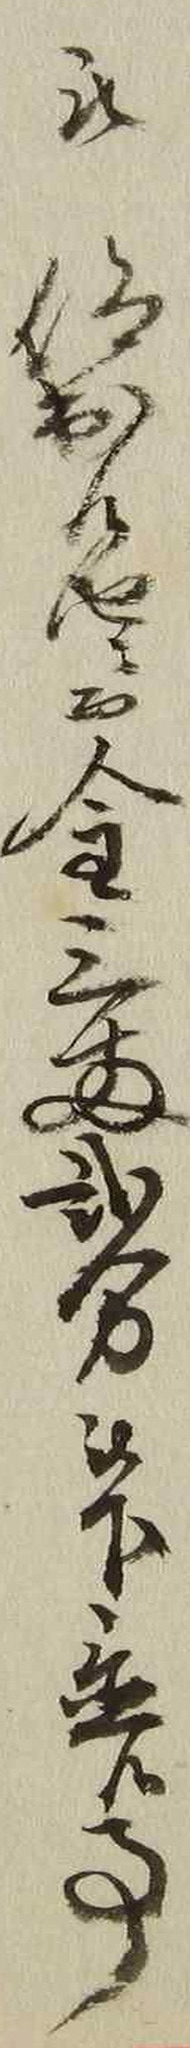被仰出候由ニ而金三両弐分被下置候事
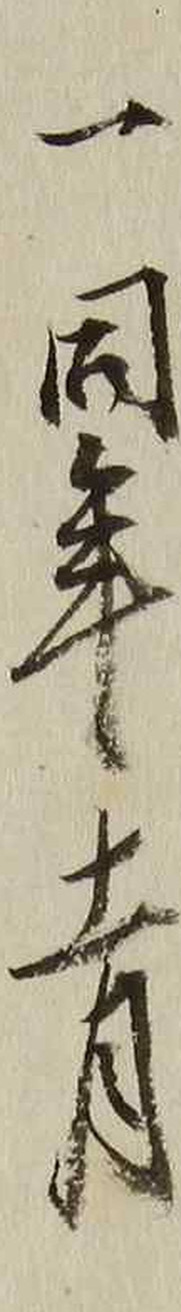一同年十一月
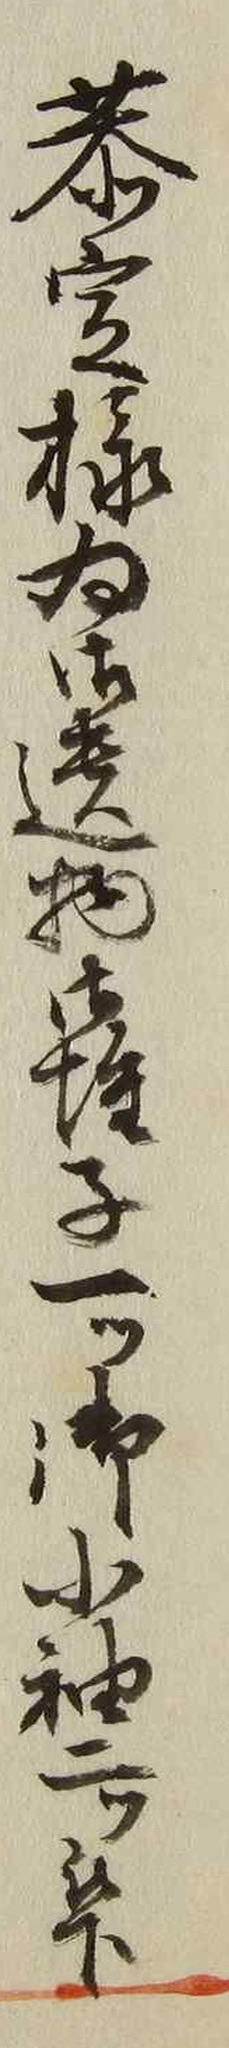恭定様為御遺物御帷子一ツ御小袖二ツ被下
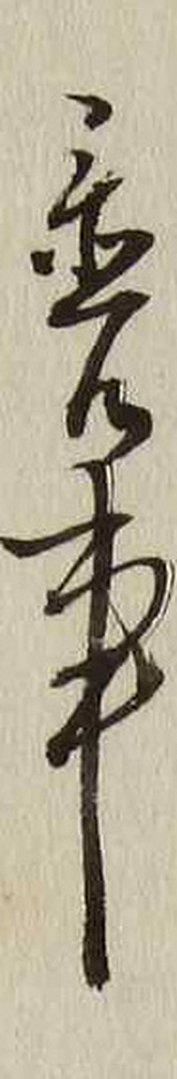置候事
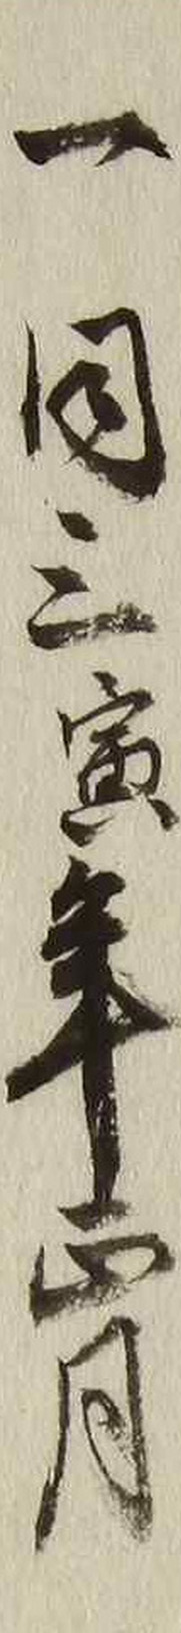一同三寅年正月
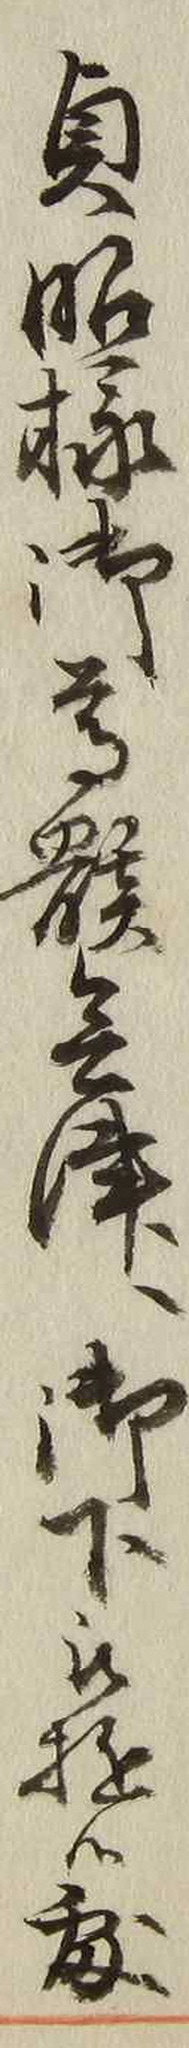貞昭様御尊骸会津へ御下被遊候処
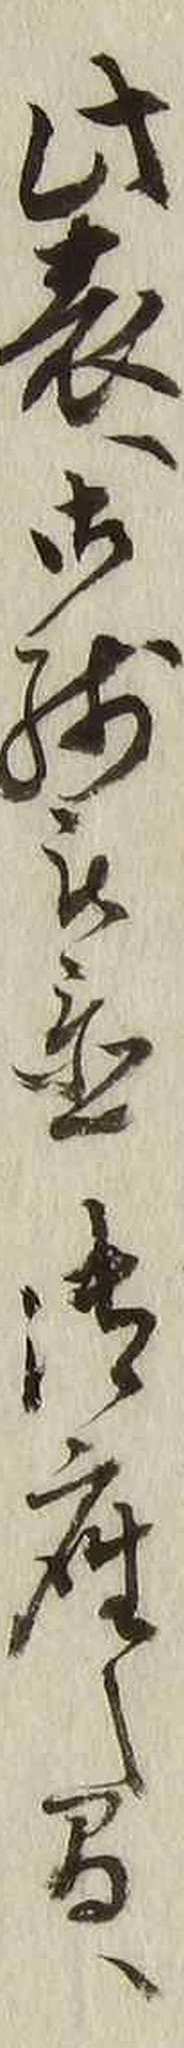此表へ御残被置御座之間へ
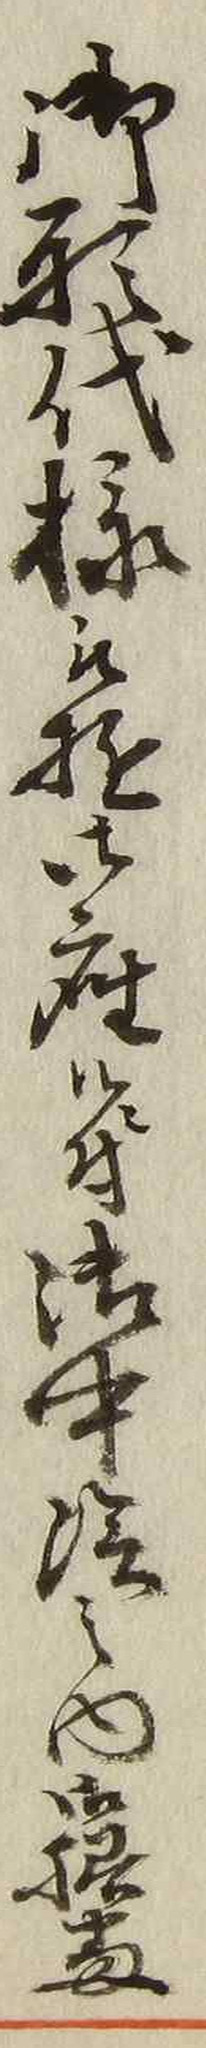御形代様被遊御座候ニ付御中陰之内御膳番
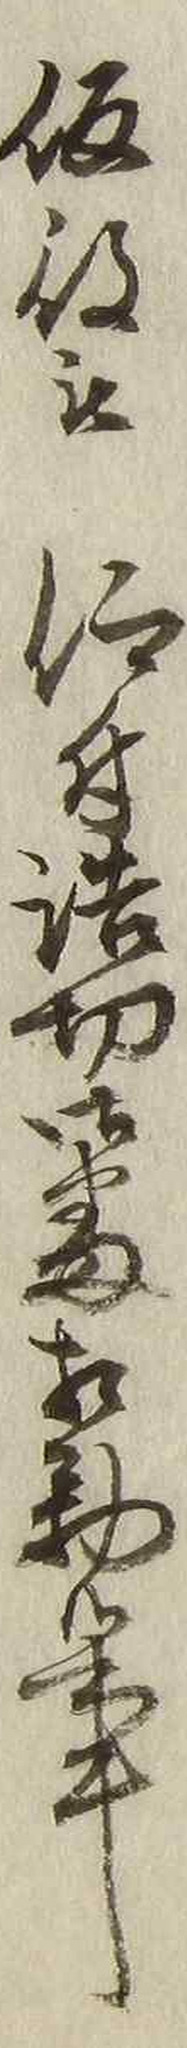仮役被仰付詰切御番相勤候事
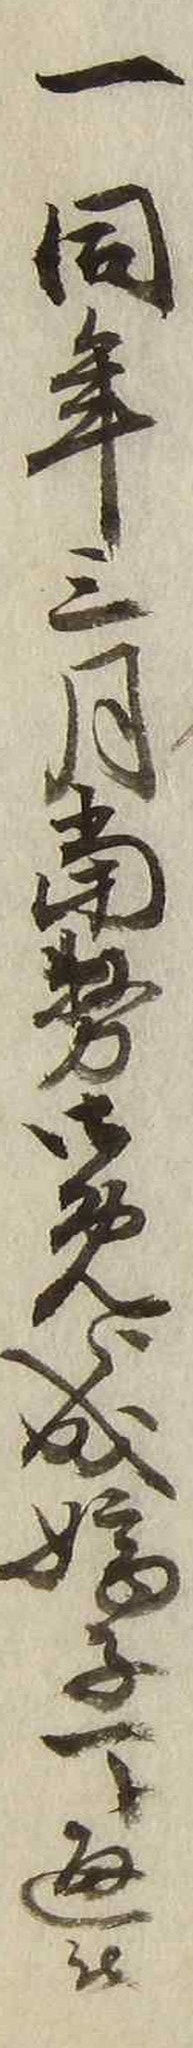一同年三月当務御免被成嫡子一ト通被
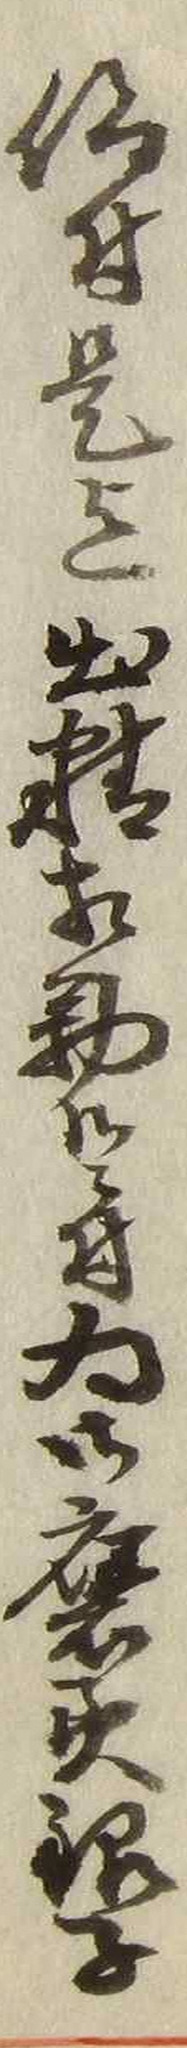仰付是迄出精相勤候ニ付為御褒美銀子
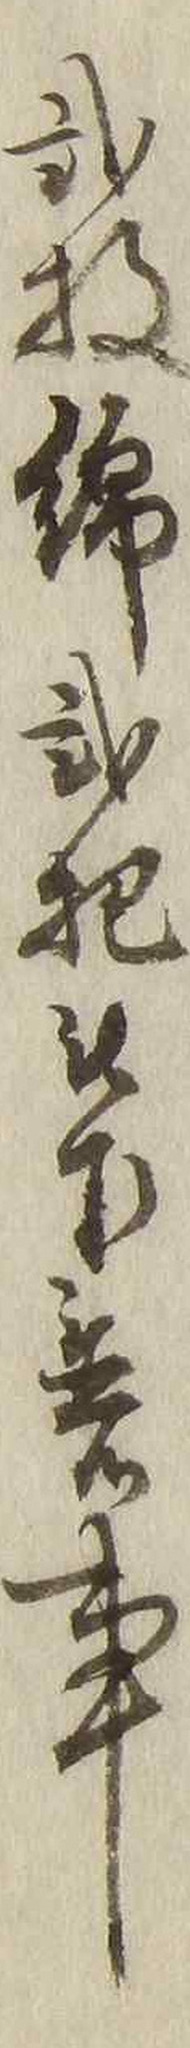弐枚綿弐把被下置候事
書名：諸士系譜　巻之23　い之部23
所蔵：会津若松市立会津図書館
